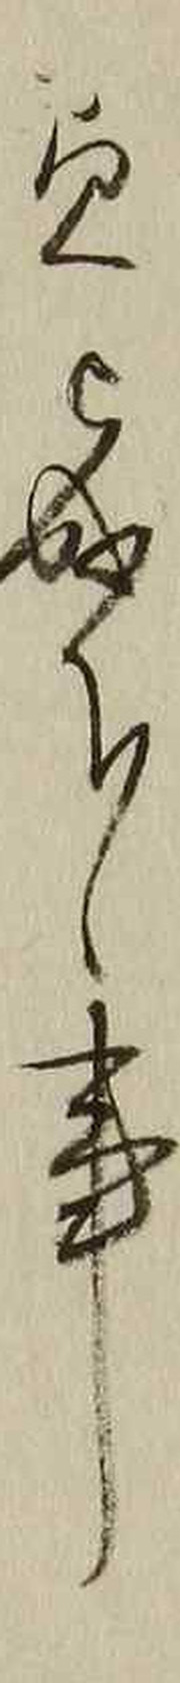美被成下候事
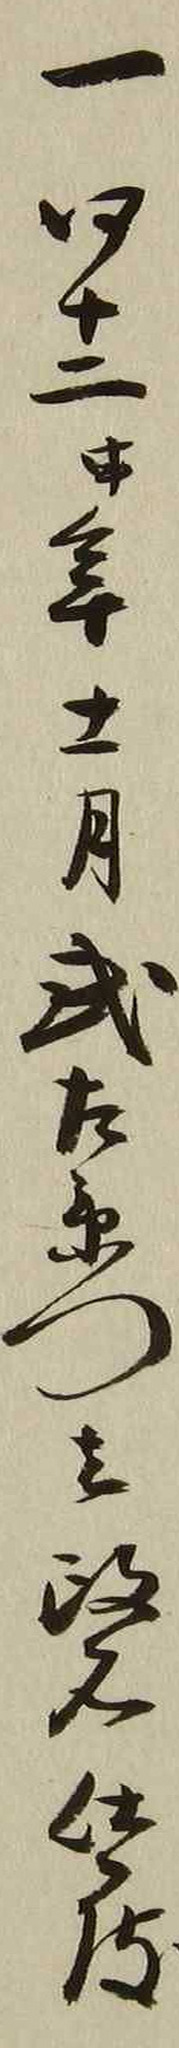一同十二申年十一月武左衛門与改名仕度
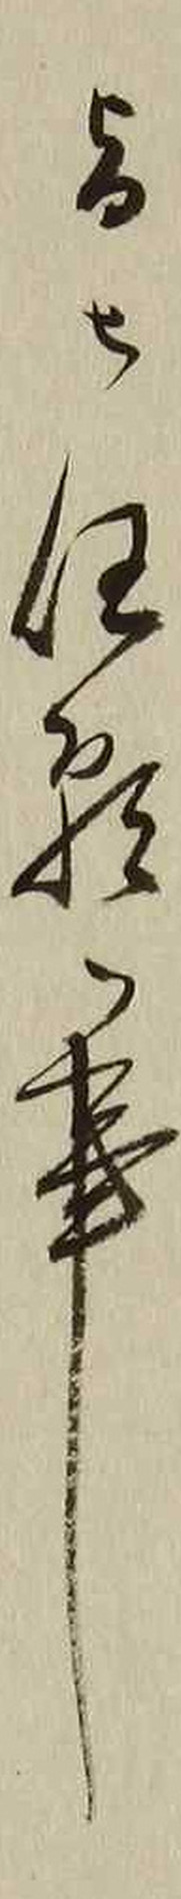旨被任願候事
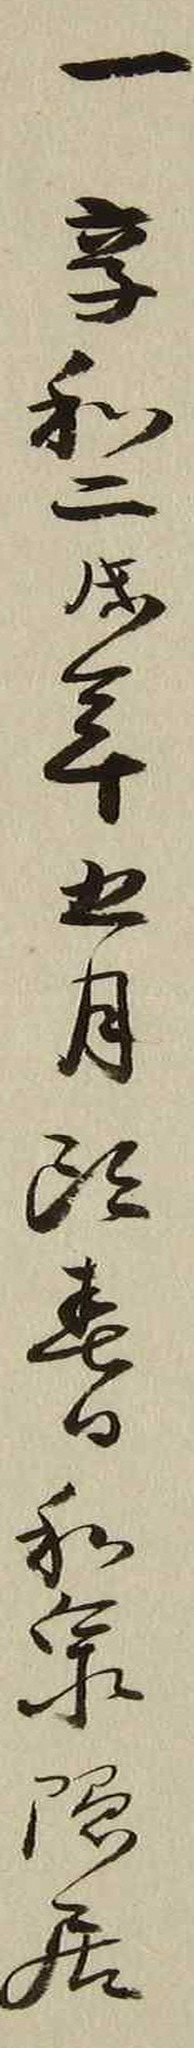一享和二戌年五月頭春日和泉隠居
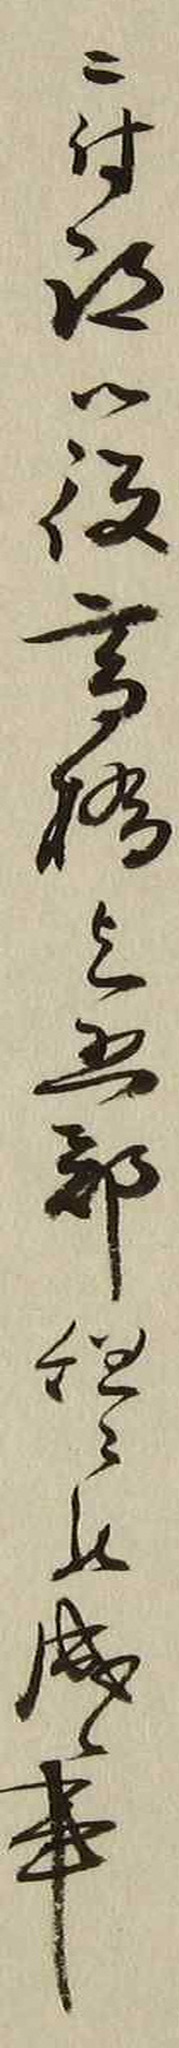ニ付跡御役高橋与五郎組ニ罷成候事
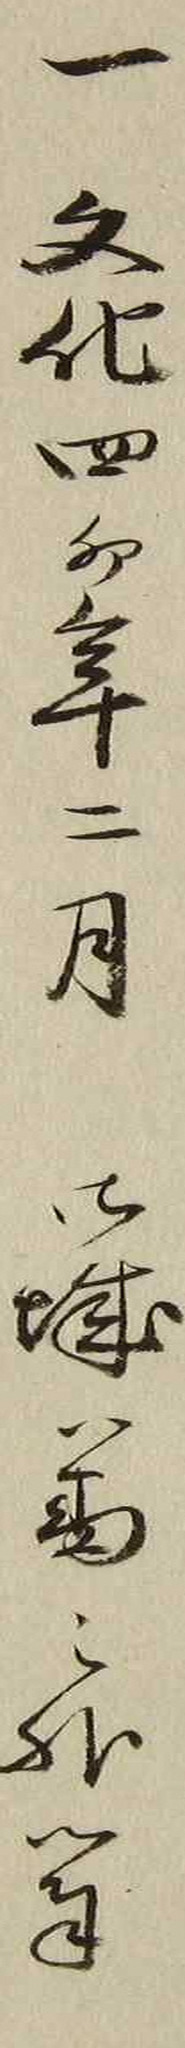一文化四卯年二月御城御番之外御奉
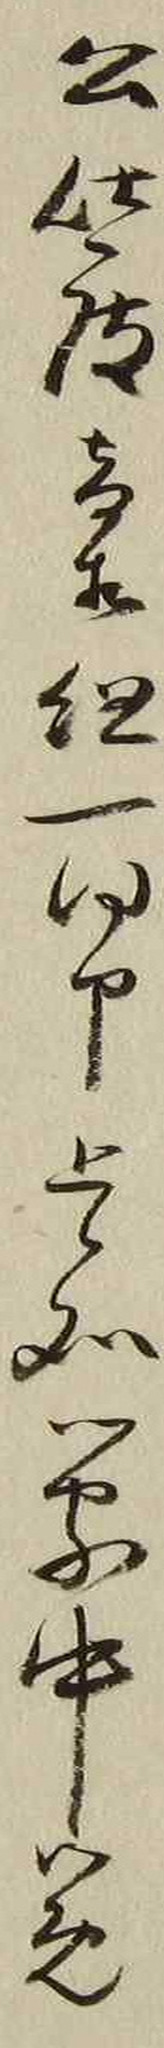公仕度旨相組一同申上候処御家中御免
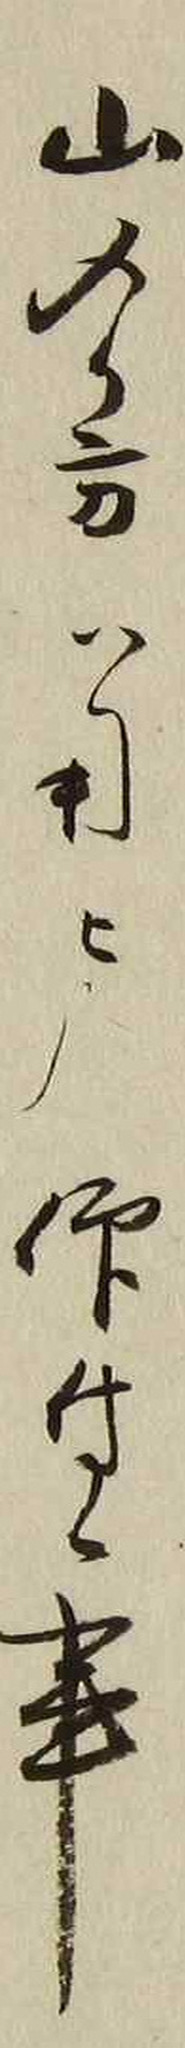山〆り方御用被仰付候事
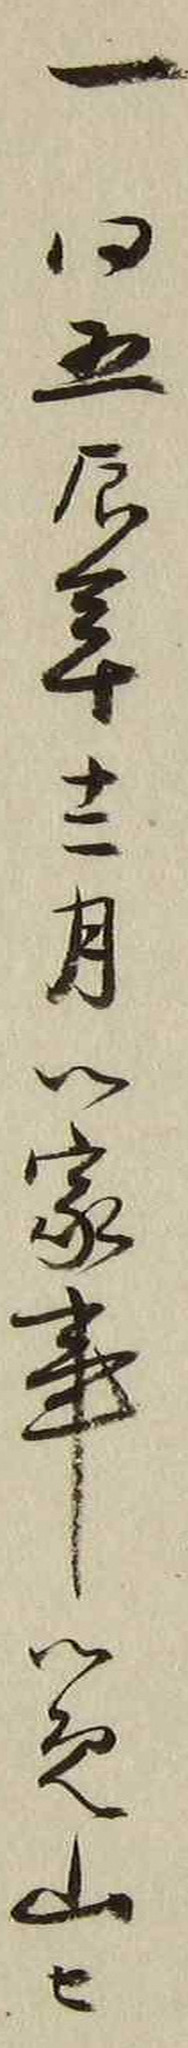一同五辰年十二月御家事御免山被
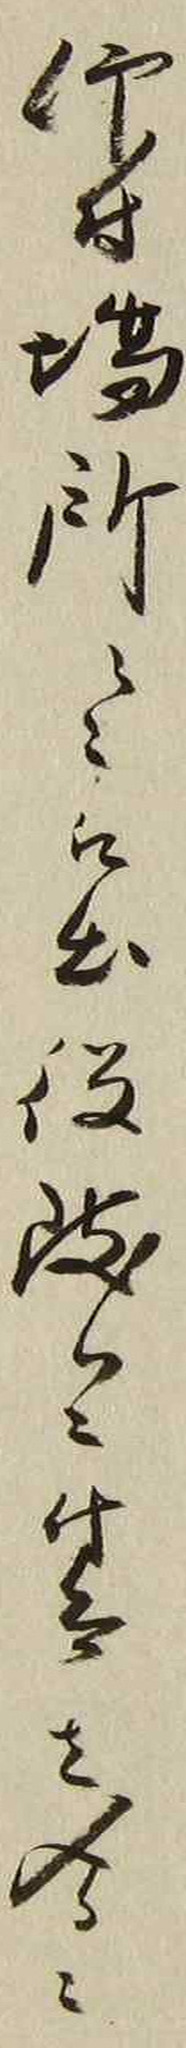仰付場所々々江出役致候ニ付而者〆りニ
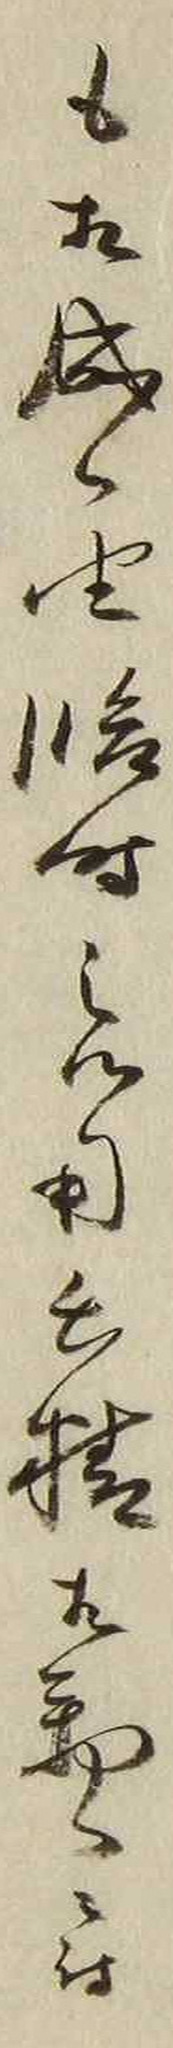も相成候由臨時之御用出精相勤候ニ付
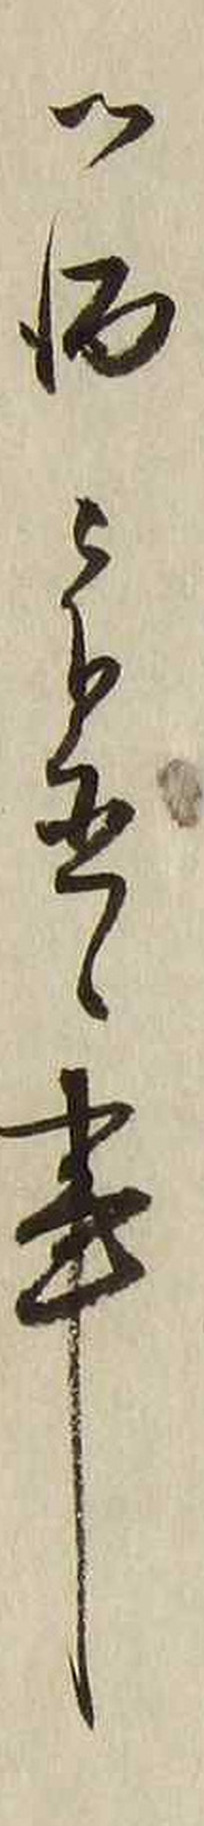御酒被下置候事
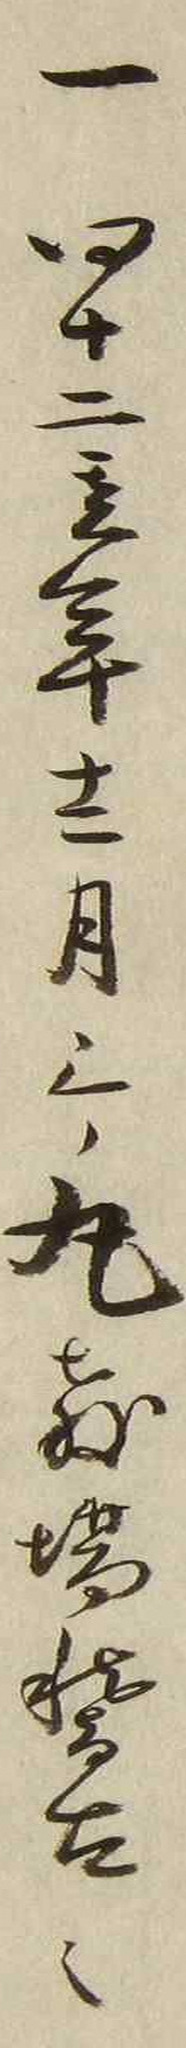一同十二亥年十二月三ノ丸教場稽古之

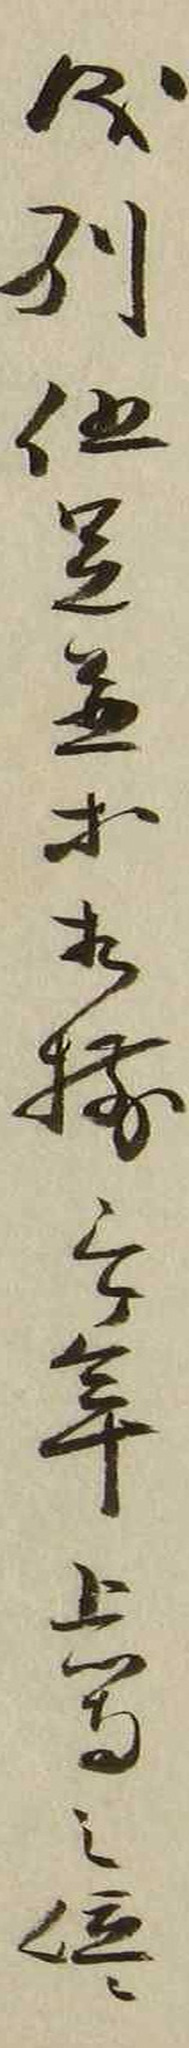儀列伍足並等相揃三ヶ年上等之位ニ
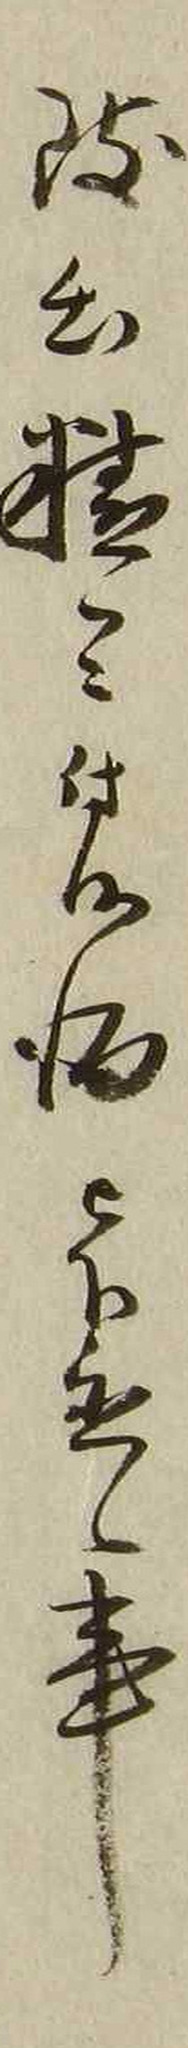致出精候ニ付御酒被下置候事
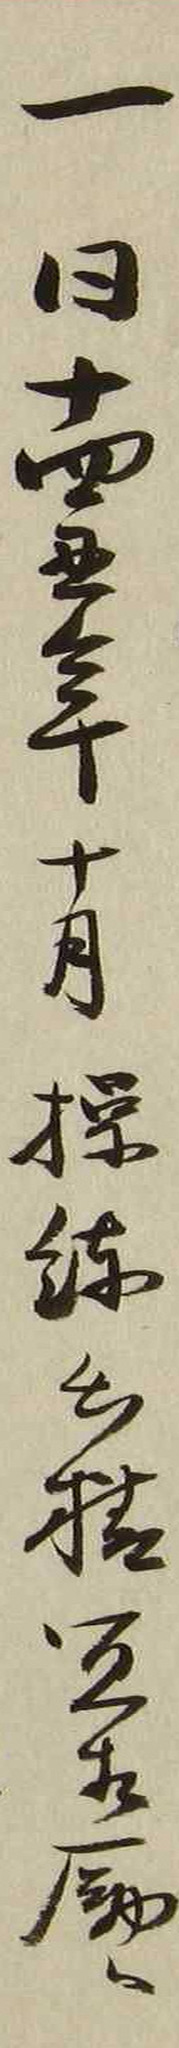一同十四丑年十月操練出精宜相励候
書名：諸士系譜　巻之288　さ之部20
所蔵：会津若松市立会津図書館
